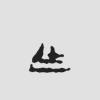乍
